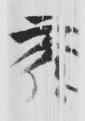而
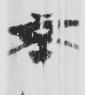不
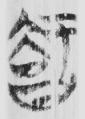智
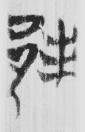邦
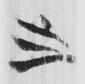之
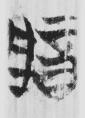𨟻
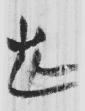{屮亡}
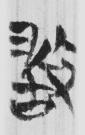敢
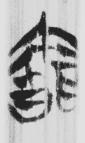{尒䎽}
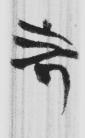先
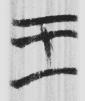王
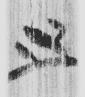之
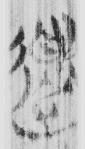遺
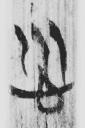{川心}
